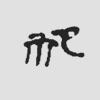祀
